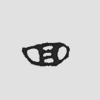四
